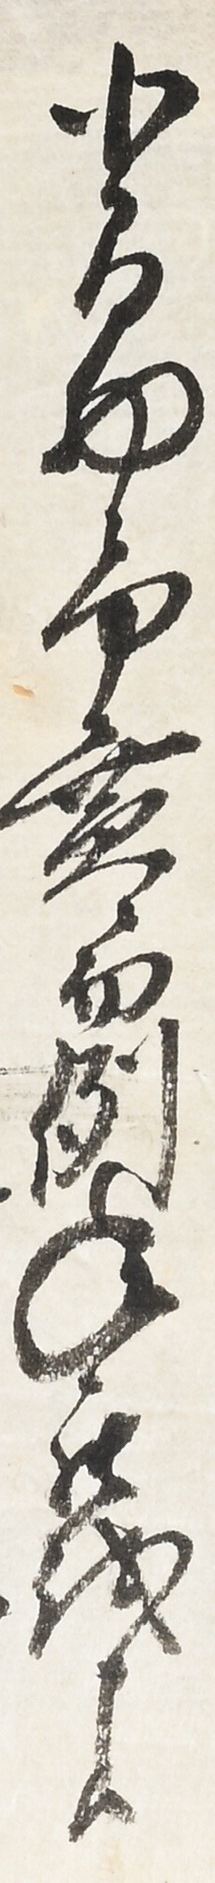小間物商売ニ而例年罷越申候
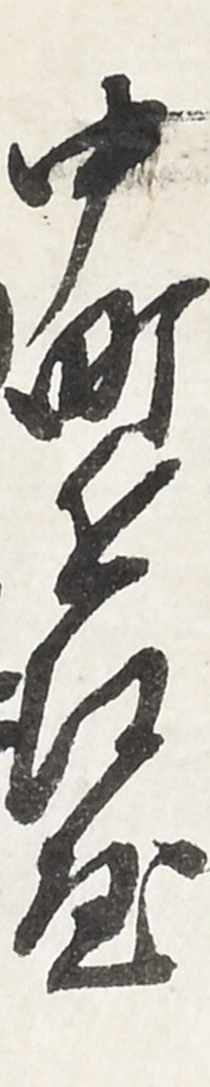中町近江屋
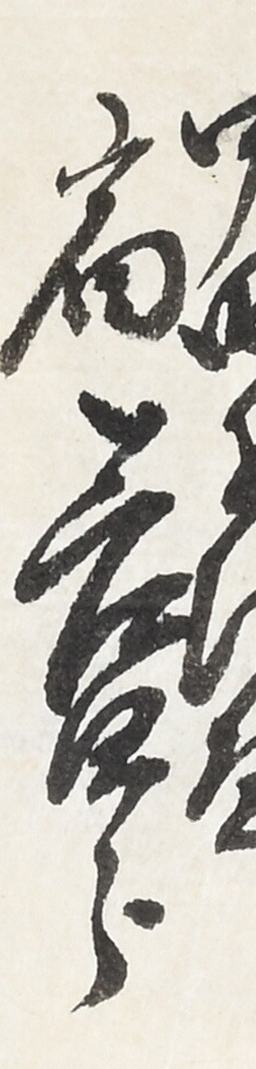宿善四郎
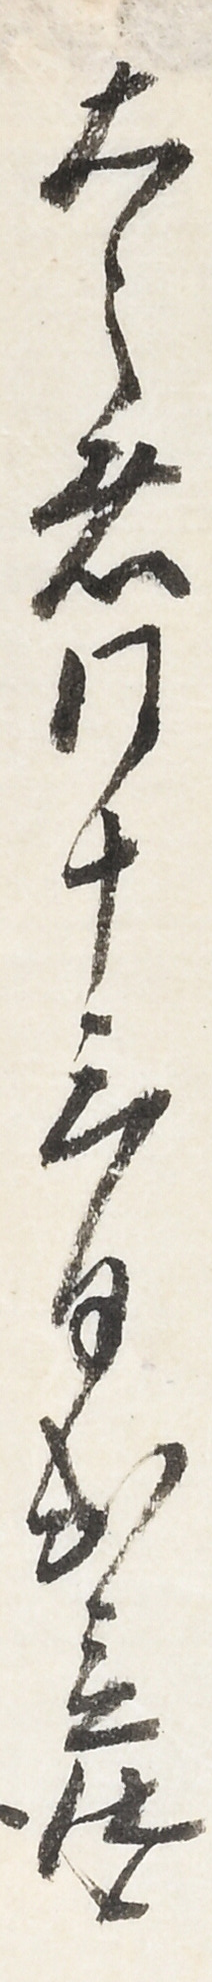右之者同十三日出立仕候
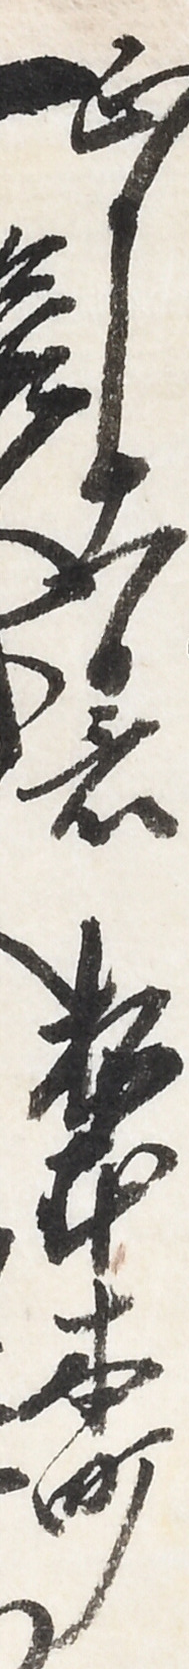正月十一日着松本本町
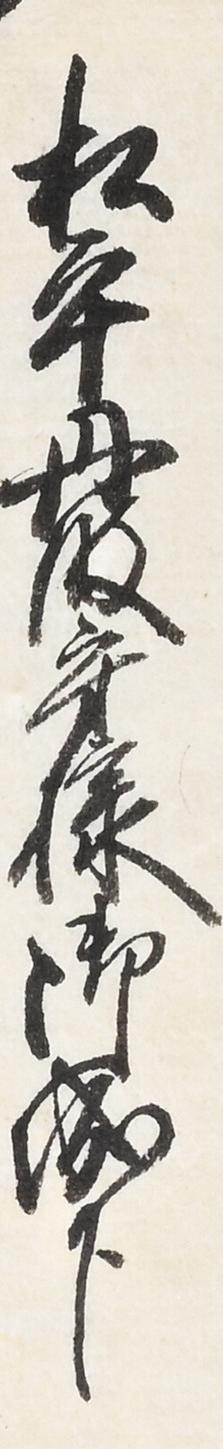松平丹波守様御城下
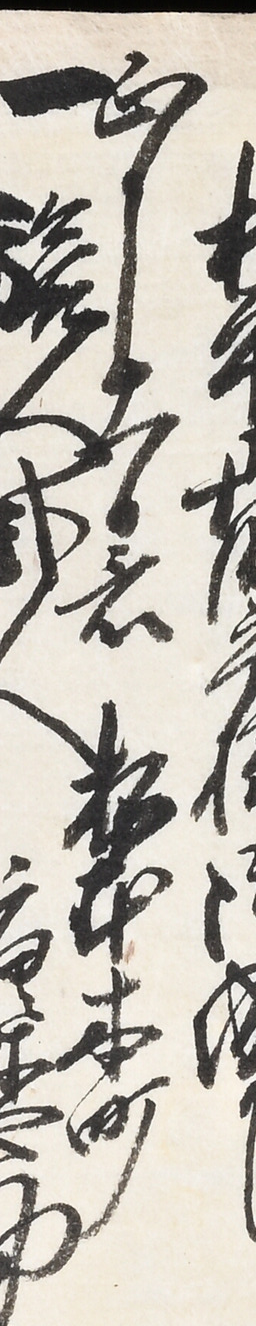正月十一日着松本本町
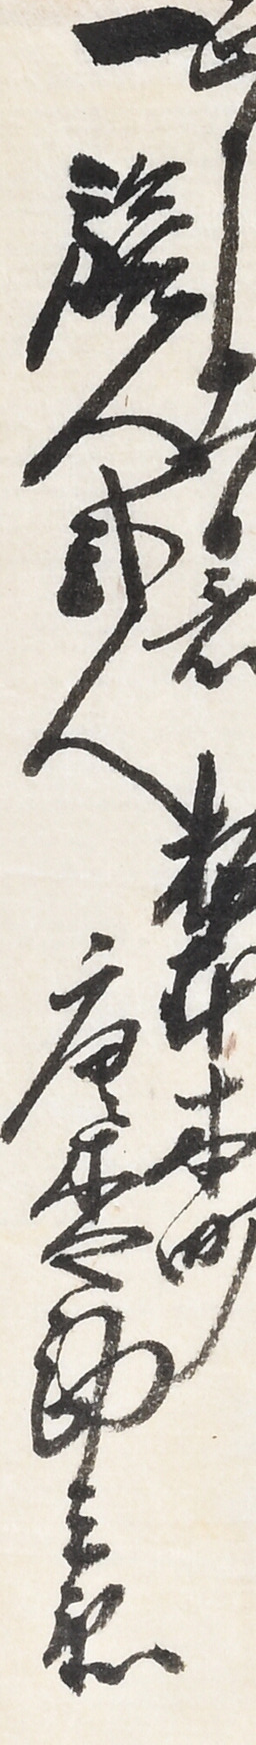一旅人弐人唐木や勘兵衛
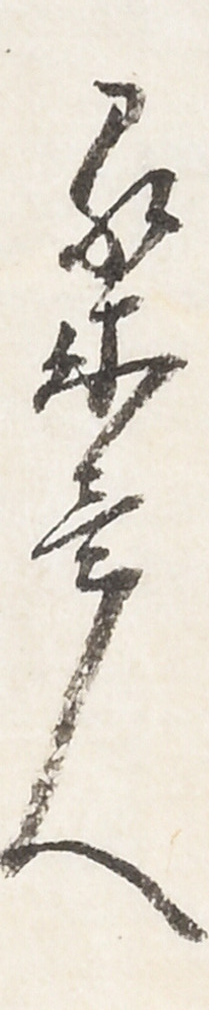家来壱人
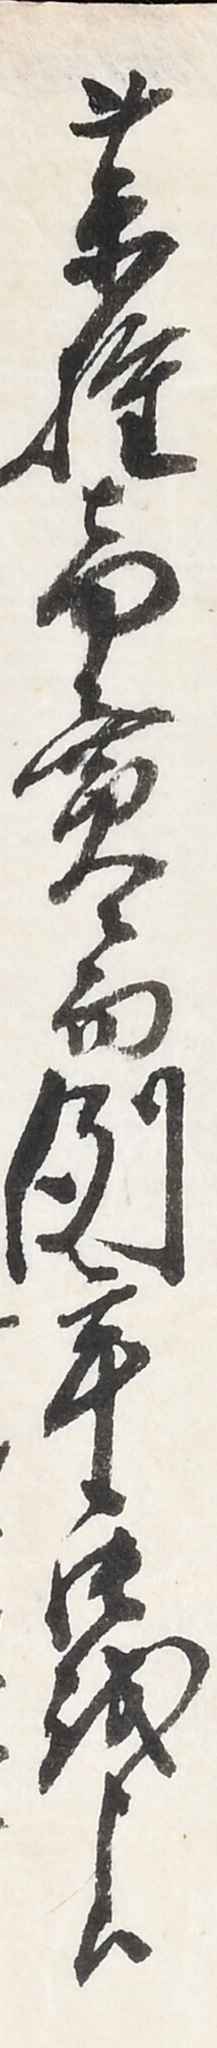薬種商売ニ而例年罷越申候
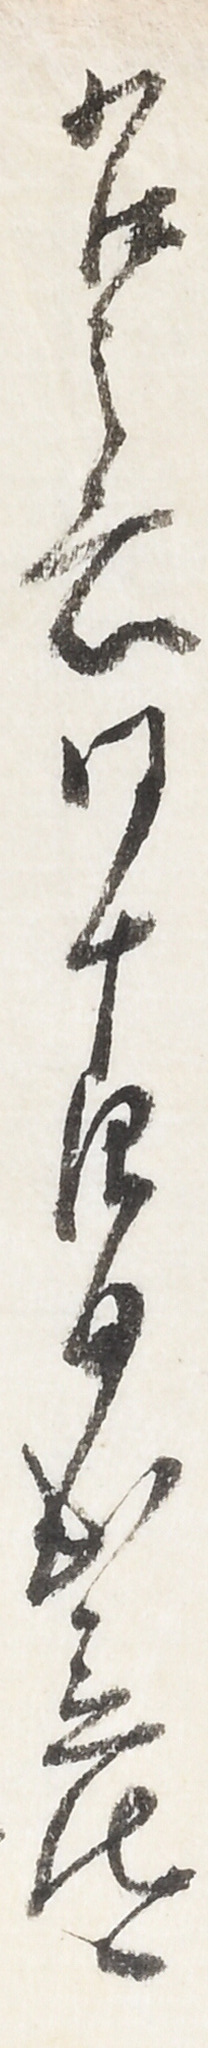右之者同十四日出立仕候
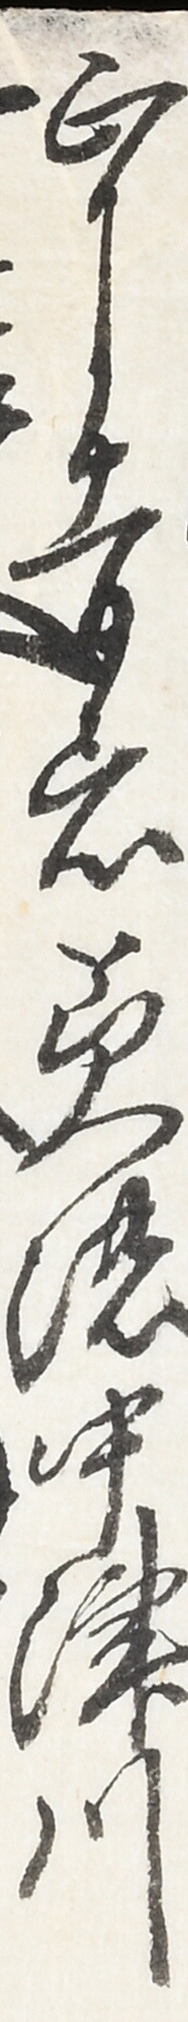正月十一日着美濃中津川
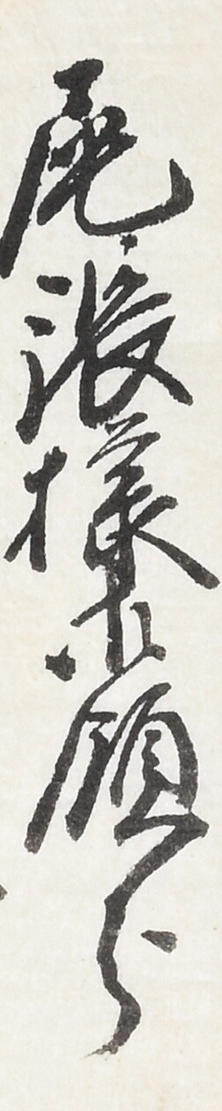尾張様御領分
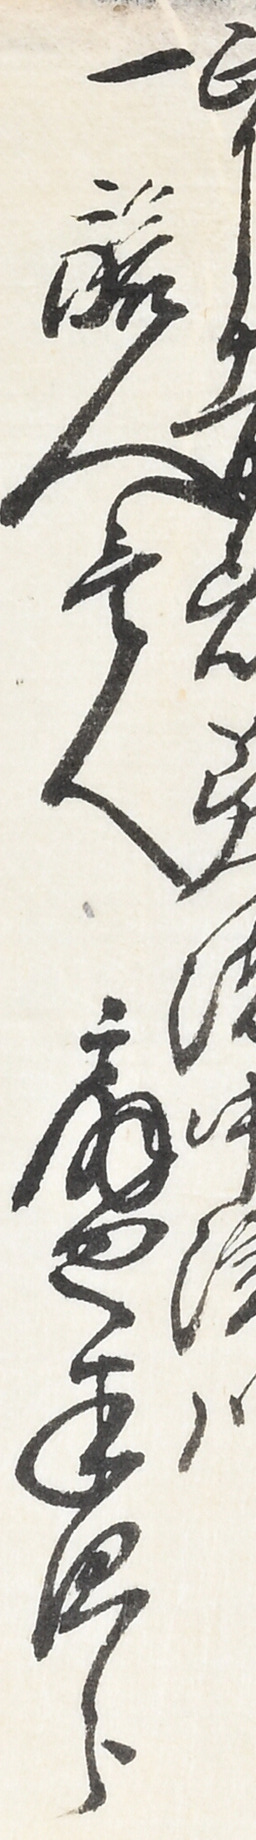一旅人壱人扇や半四郎
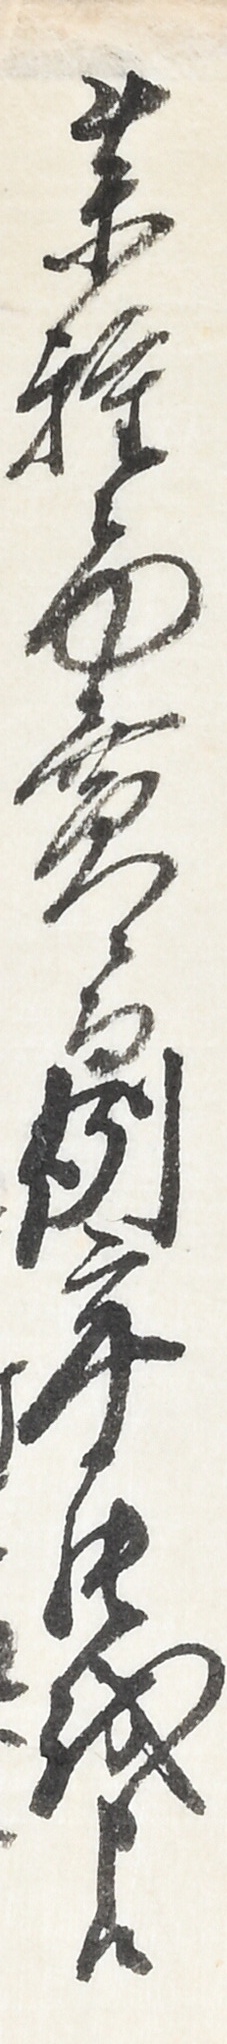薬種商売ニ而例年罷越申候
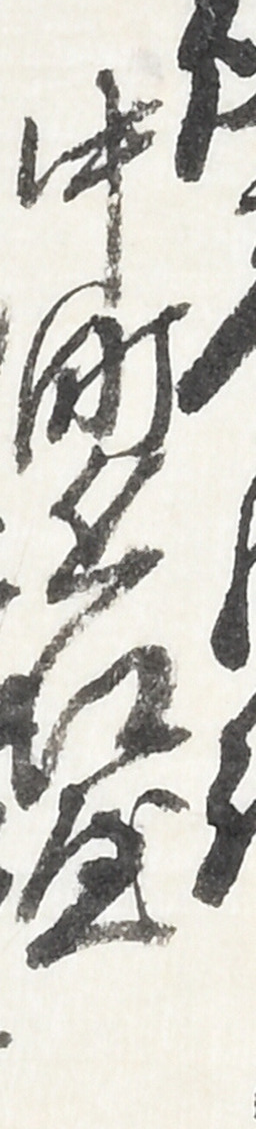中町近江屋
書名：旅人泊控帳
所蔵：伊那市立高遠町図書館・合同会社AMANE
